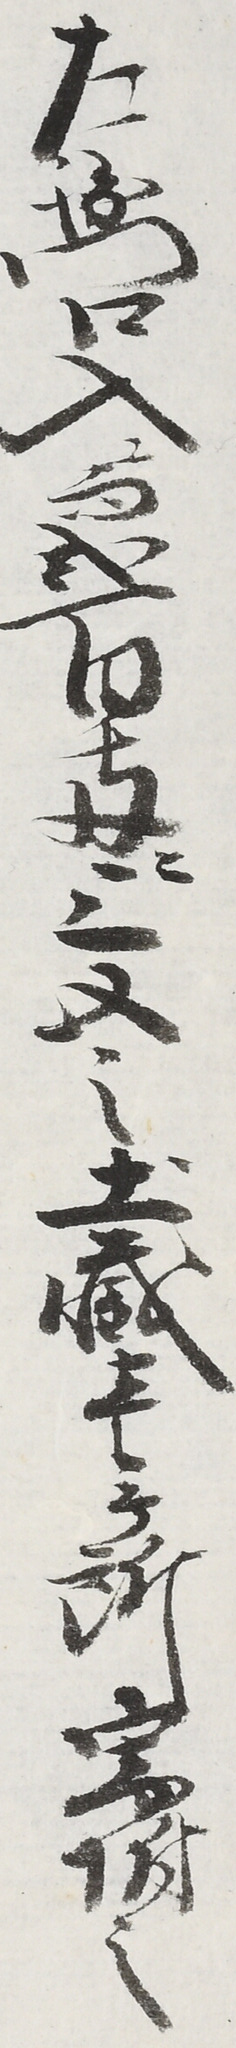左衛門口入ニ而弐百両ニ三五之土蔵壱ヶ所寄附之
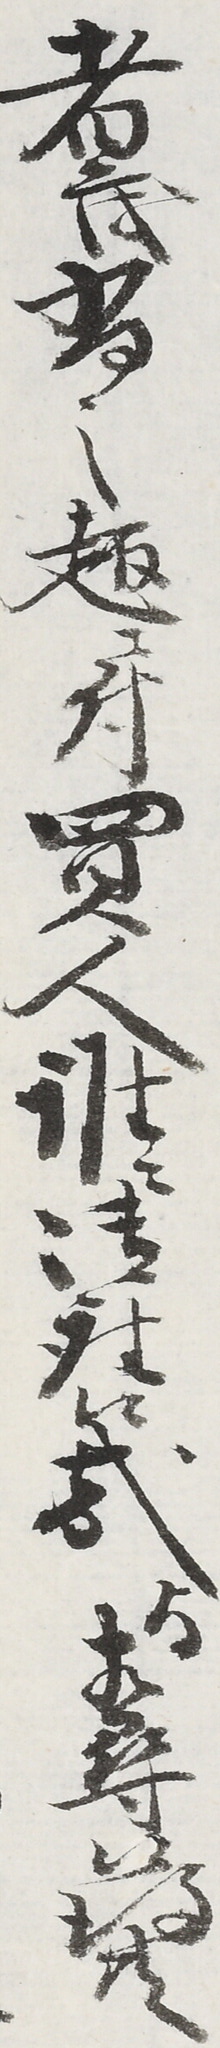者茂有之趣ニ付買入誰ニ御座候哉与相尋候得共
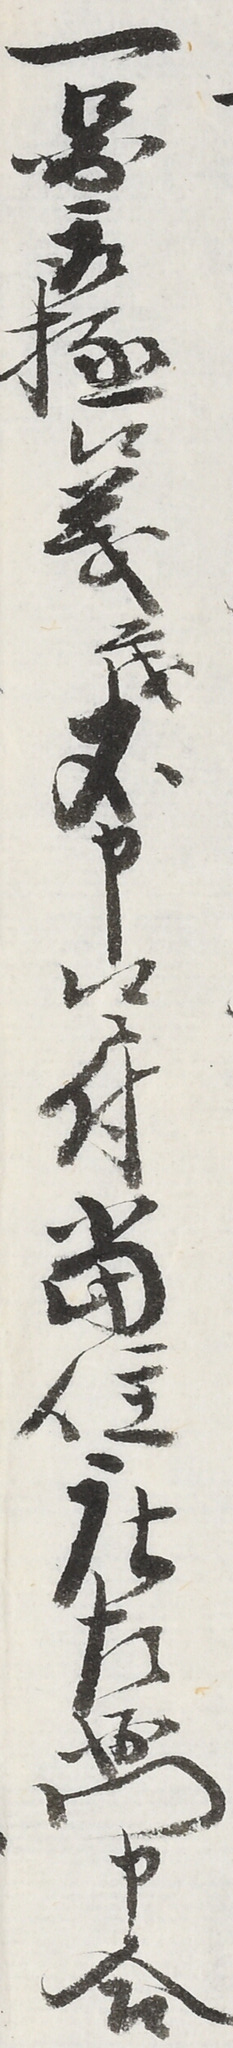一図取決候義茂不申候ニ付当住庄左衛門申合
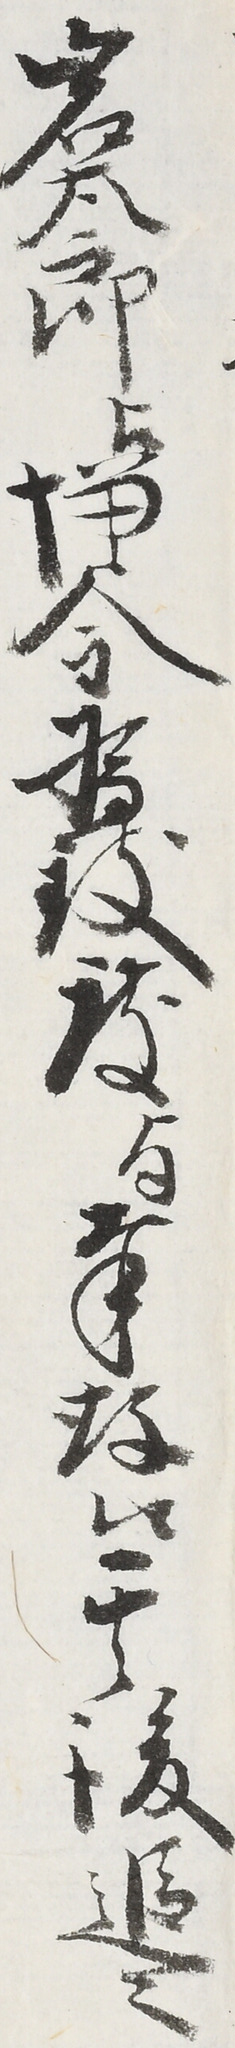岩太郎与増金為致度与奉存候其後追々
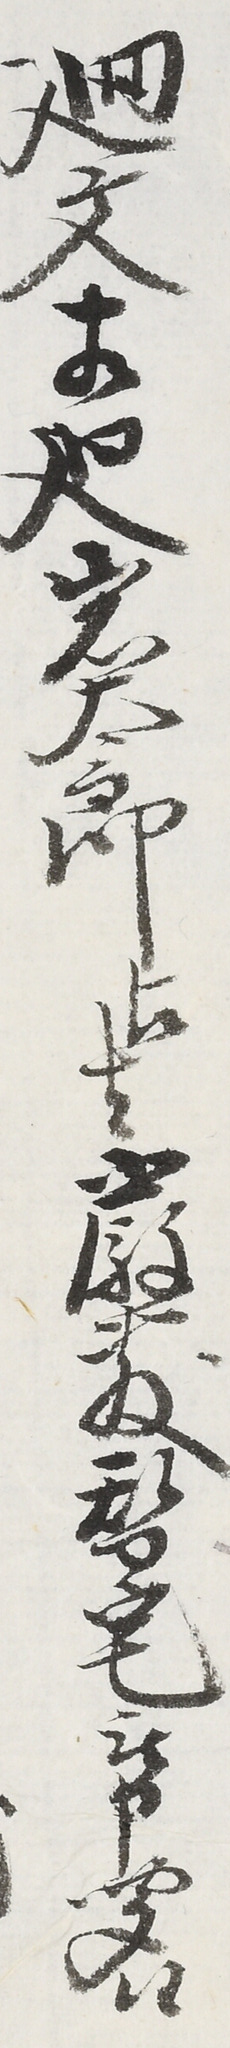廻文相廻岩太郎江者厳敷替宅被申聞候
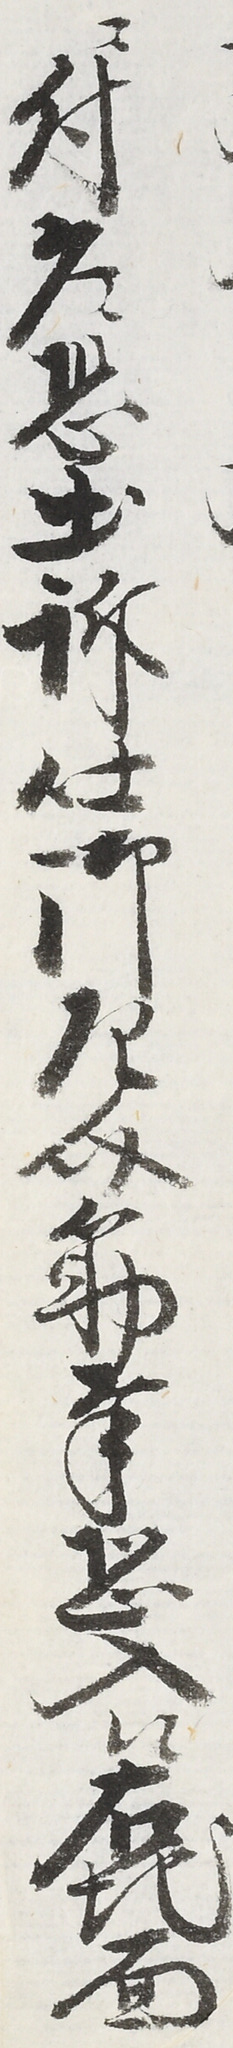ニ付乍恐出訴仕御厄介筋奉恐入候右地面
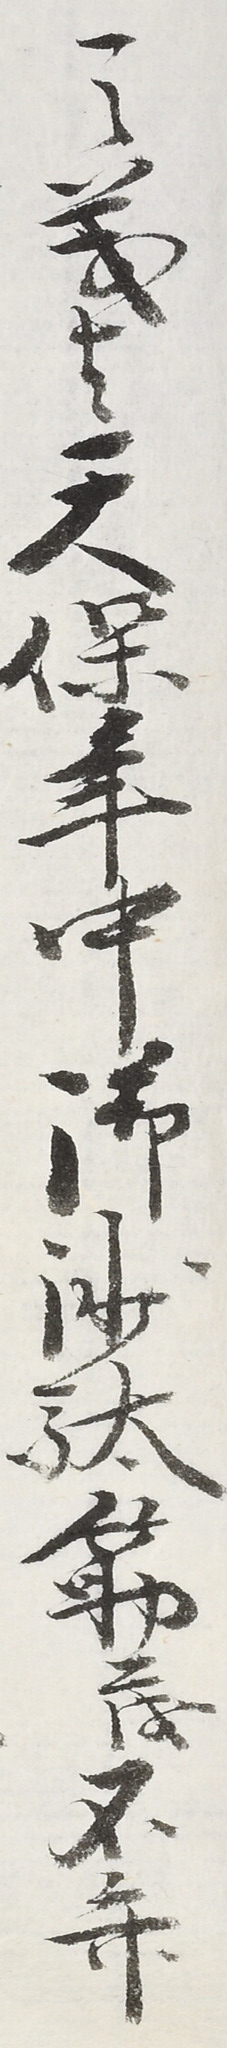之義者天保年中御沙汰筋茂不弁
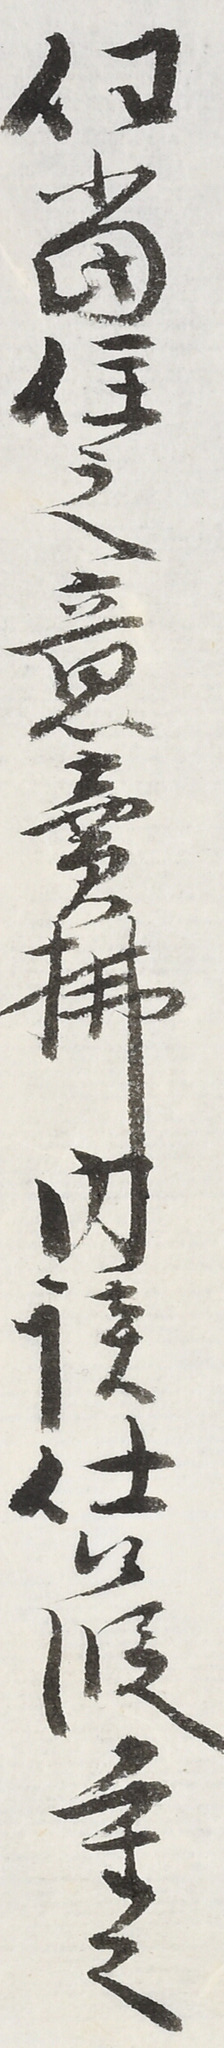任当住之意売払内談仕候段重々
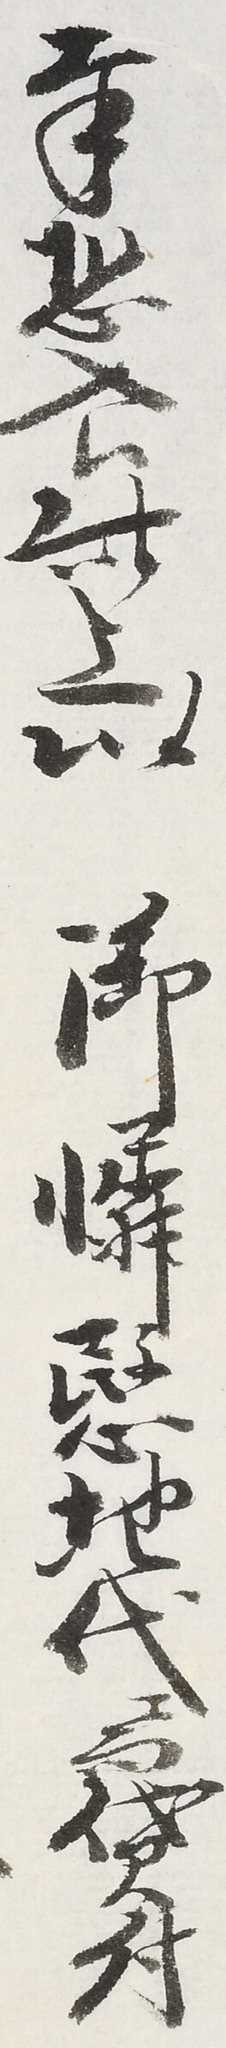奉恐入候此上以御憐愍地代ニ而貸付
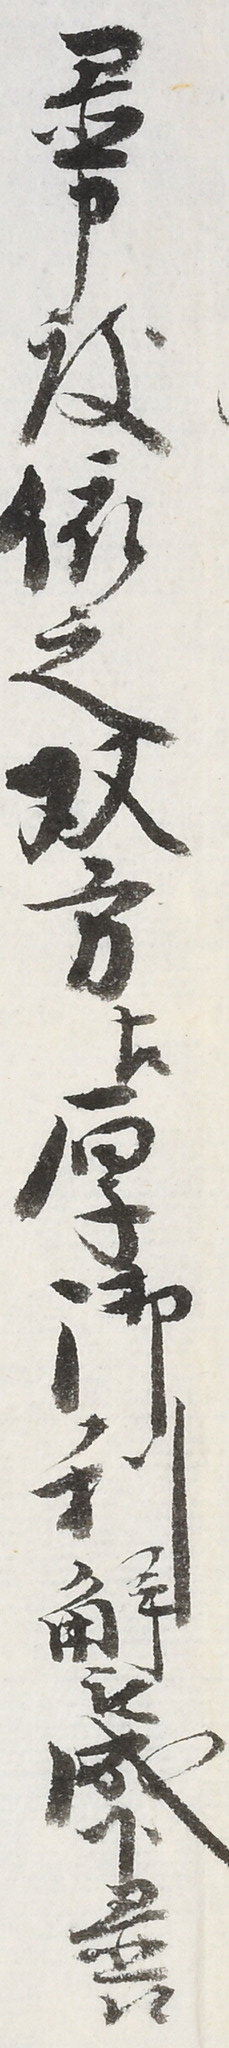置申致依之双方江厚御利解被成下置候
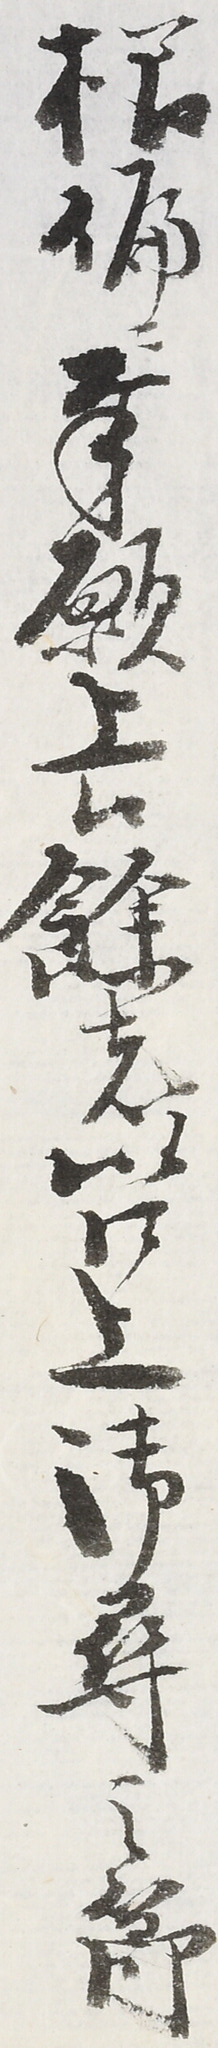様偏ニ奉願上候余者以口上御尋之節
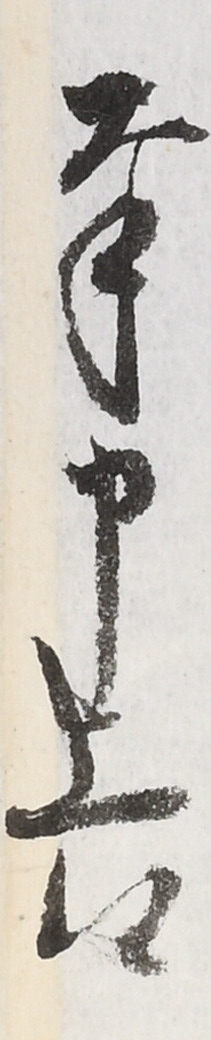奉申上候
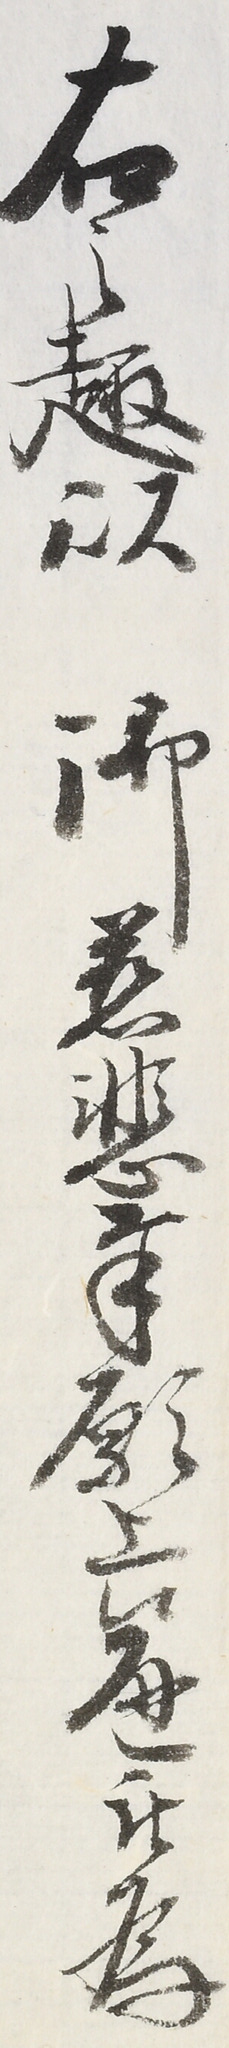右之趣以御慈悲奉願上候通被為
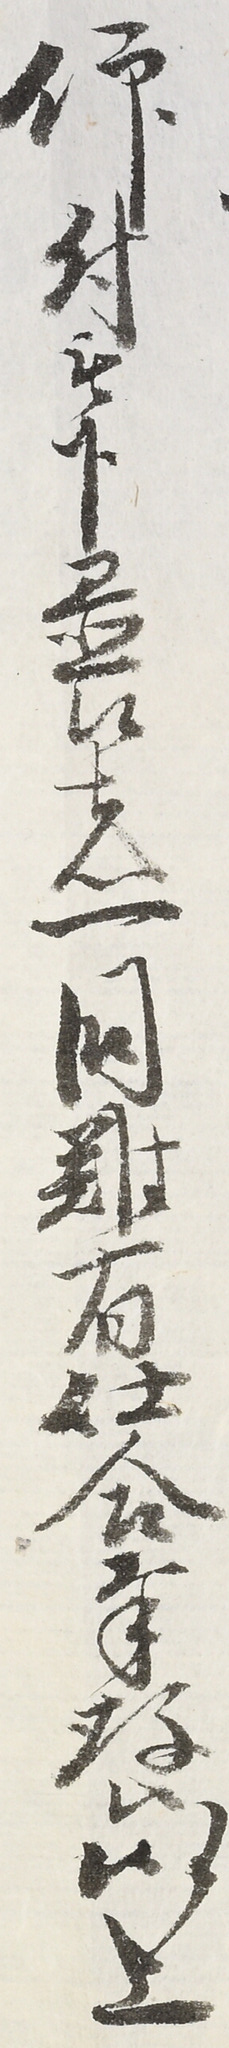仰付被下置候者一同難有仕合奉存候以上
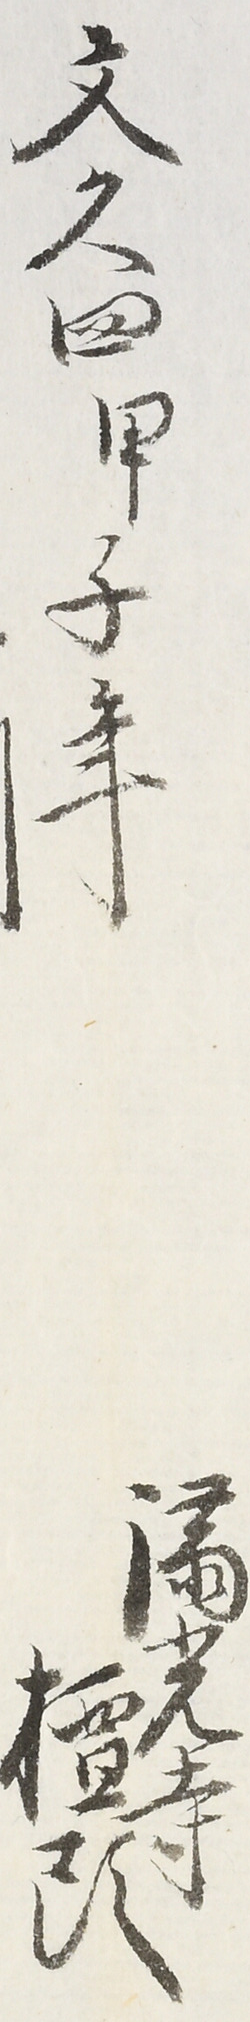文久四甲子年檀頭
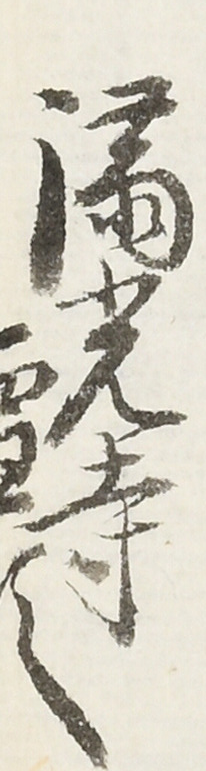満光寺
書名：乍恐以口上書奉願上候御事
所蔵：伊那市立高遠町図書館・合同会社AMANE
